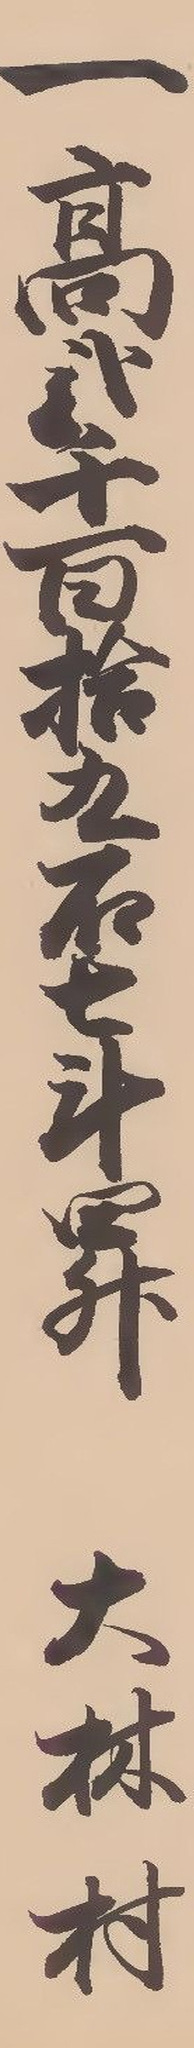一高弐千百拾九石七斗四升大林村

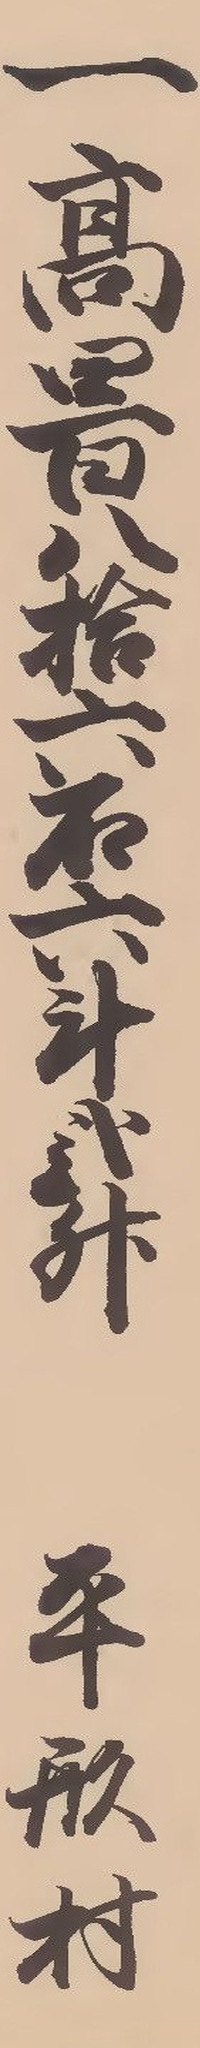一高四百八拾六石六斗弐升平形村
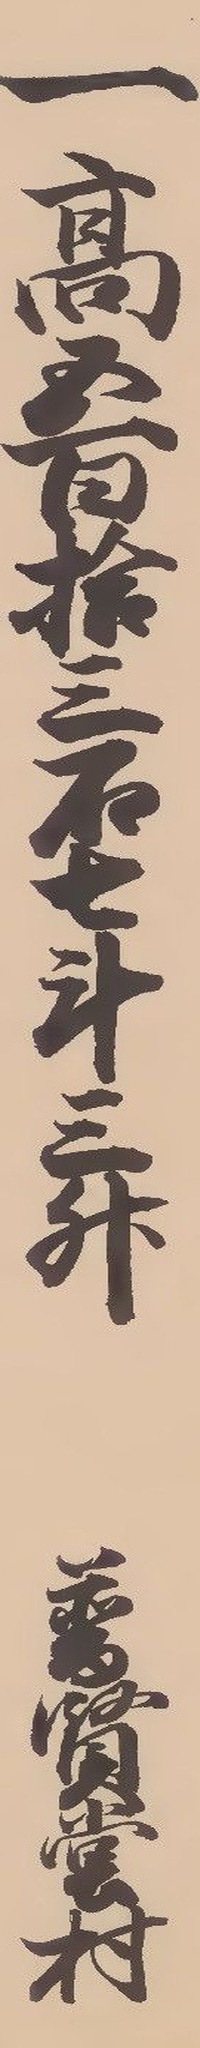一高五百拾三石七斗三升普賢堂村
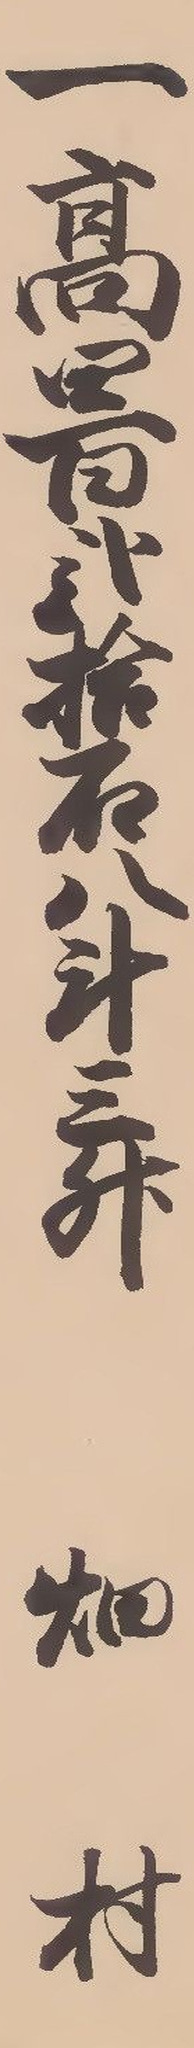一高四百弐拾石八斗三升畑村
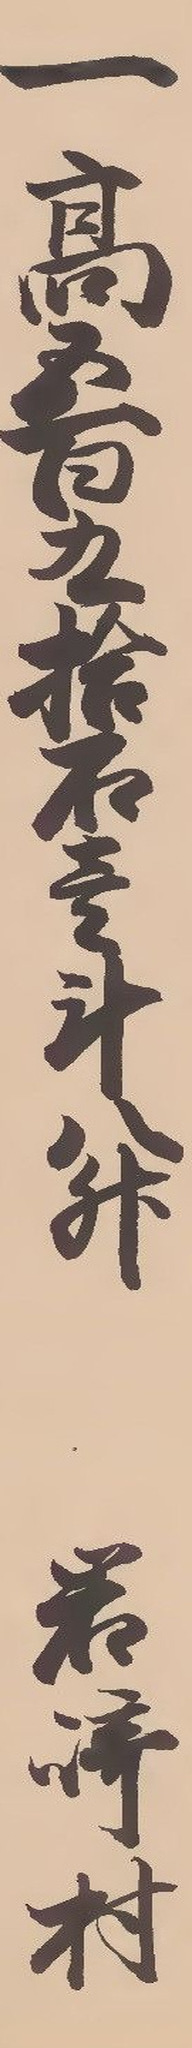一高五百九拾石壱斗八升岩崎村
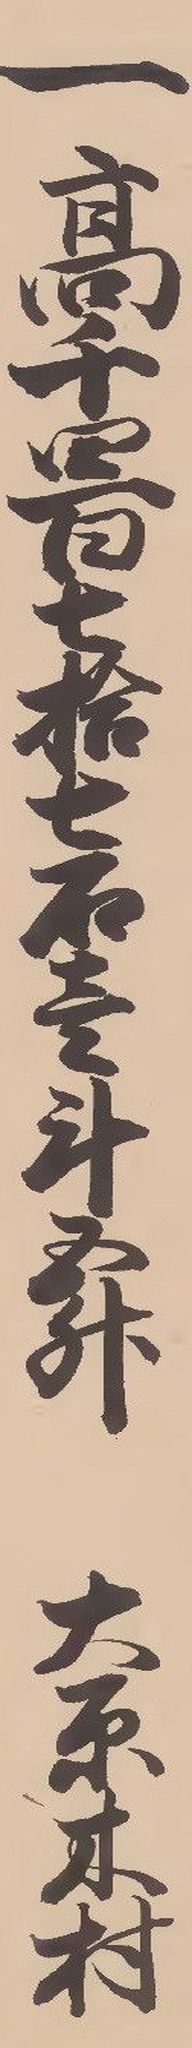一高千四百七拾七石壱斗五升大原木村
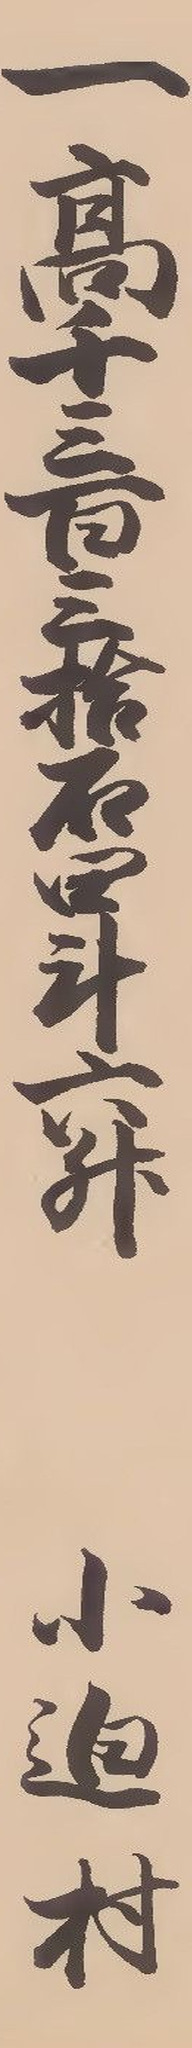一高千三百三拾石四斗六升小迫村
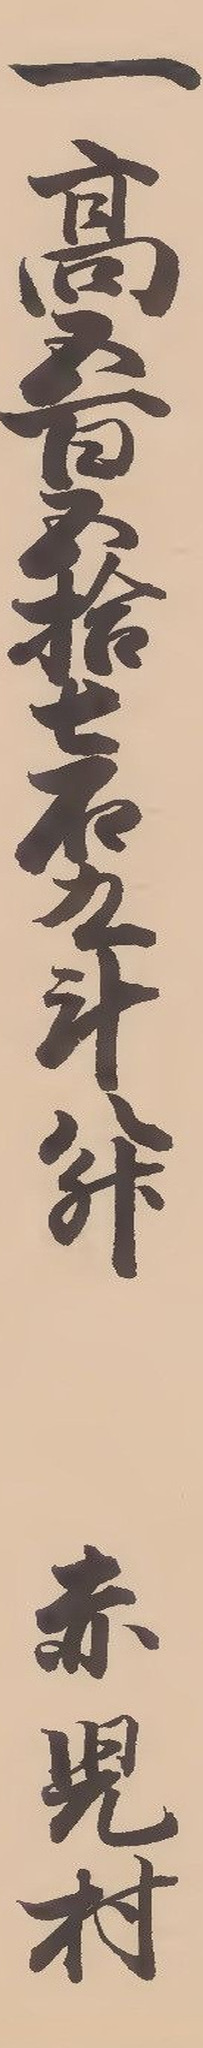一高五百五拾七石九斗八升赤児村
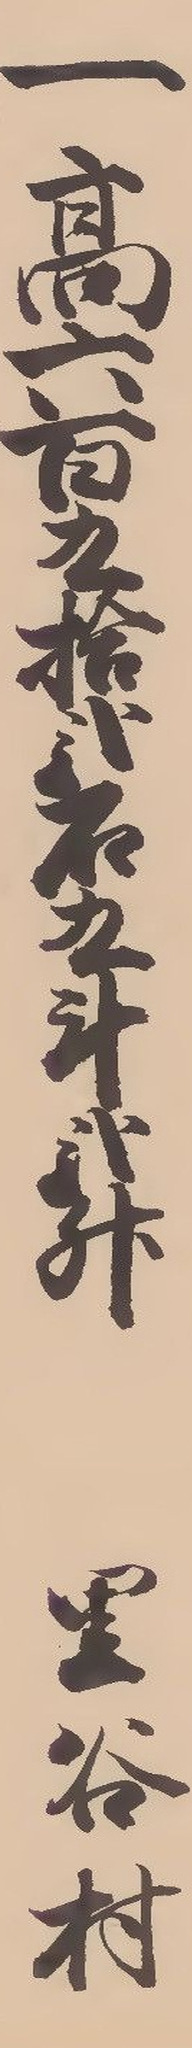一高六百九拾弐石九斗弐升里谷村

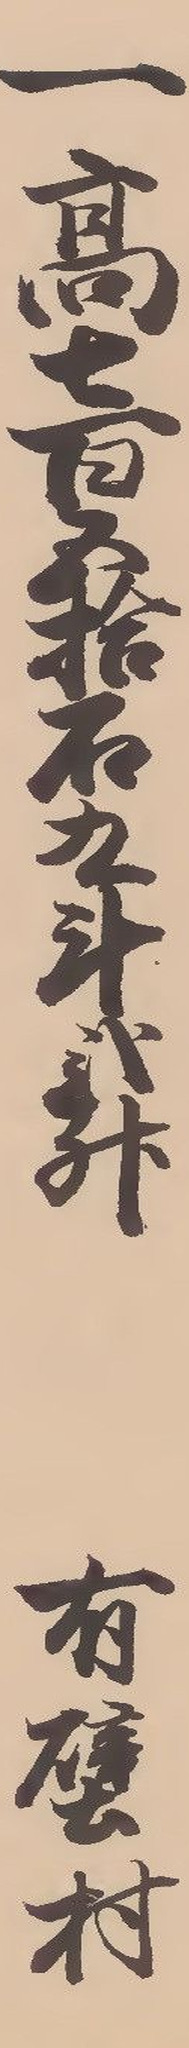一高七百五拾石九斗弐升有壁村
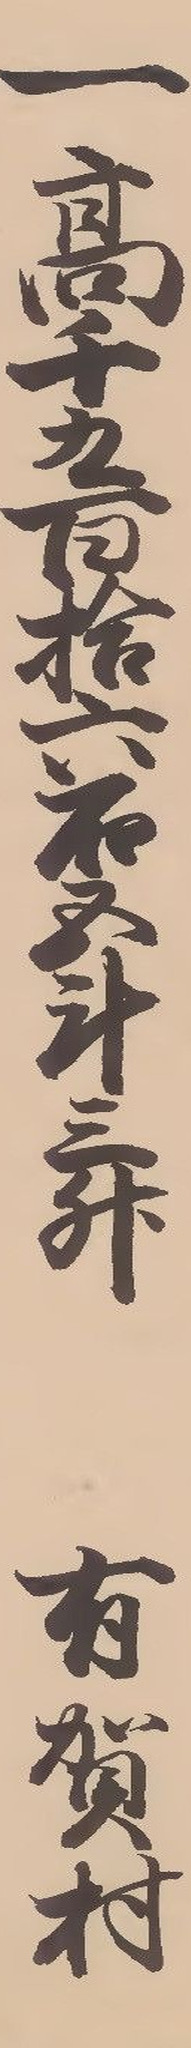一高千九百拾六石五斗三升有賀村
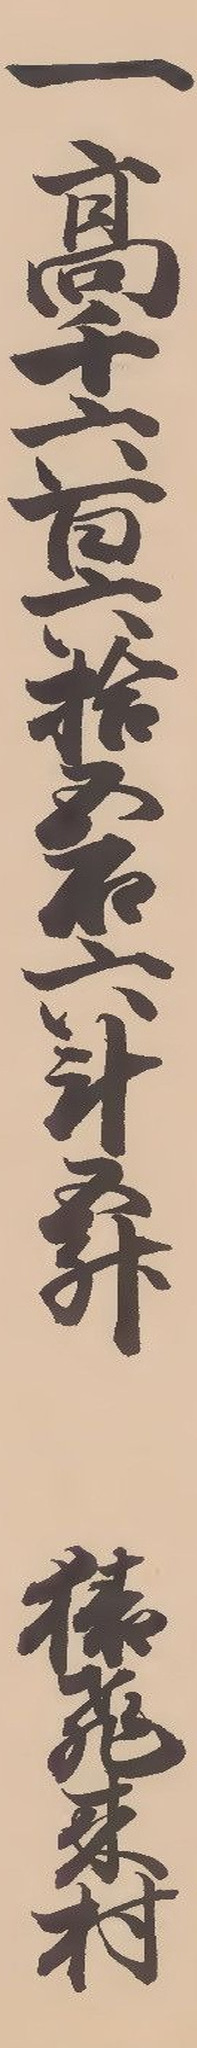一高千六百六拾五石六斗五升猿飛来村
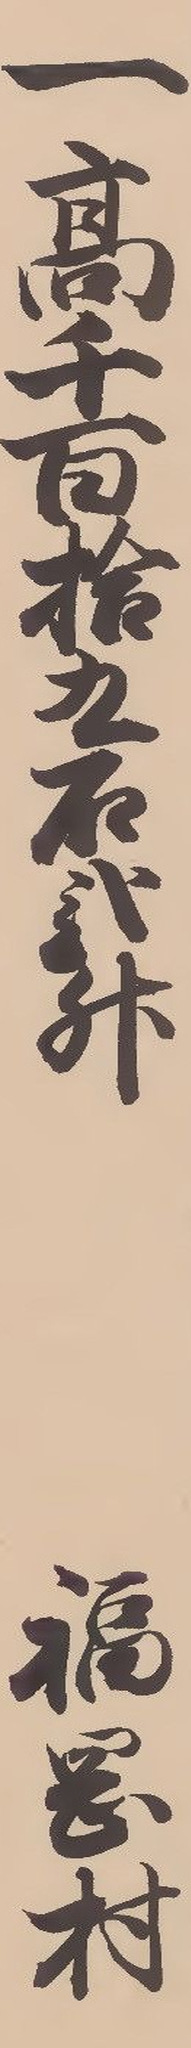一高千百拾九石弐升福岡村
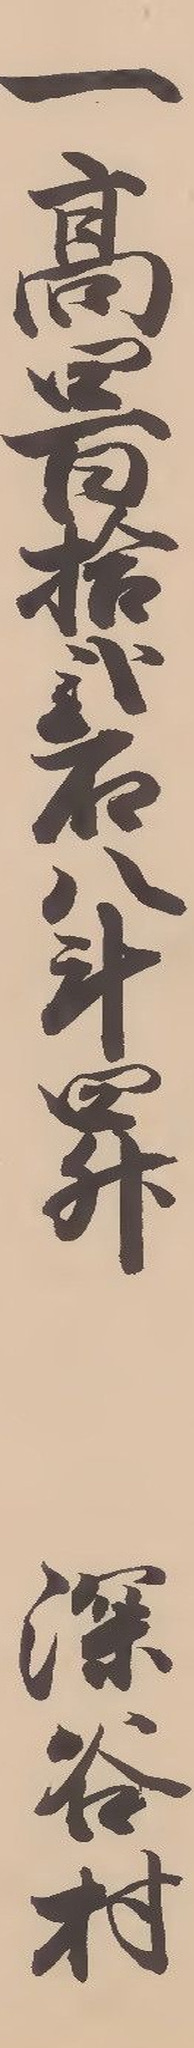一高四百拾弐石八斗四升深谷村
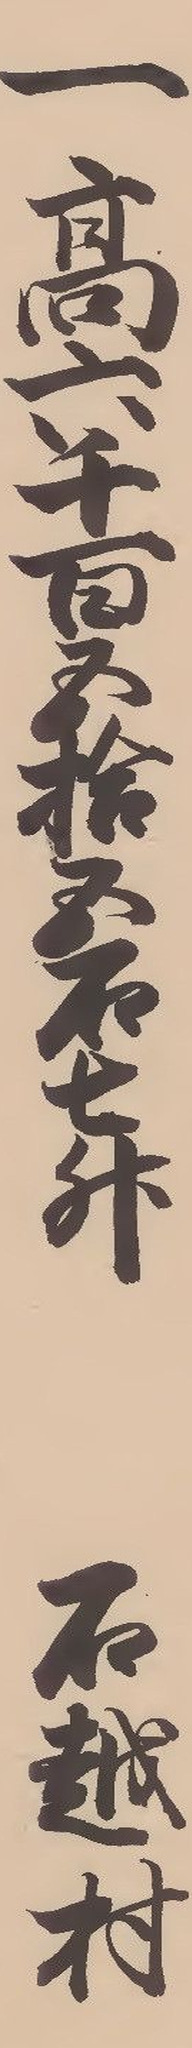一高六千百五拾五石七升石越村
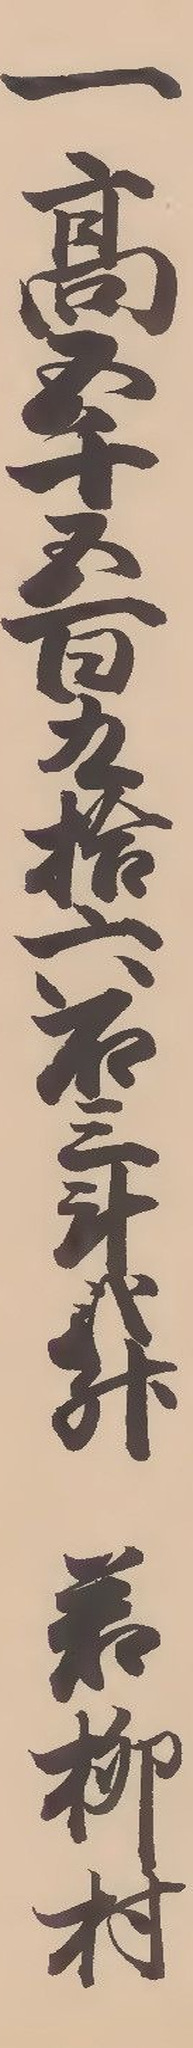一高五千五百九拾六石三斗弐升若柳村
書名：陸奥国郷帳　５
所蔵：国立公文書館 National Archives of Japan
